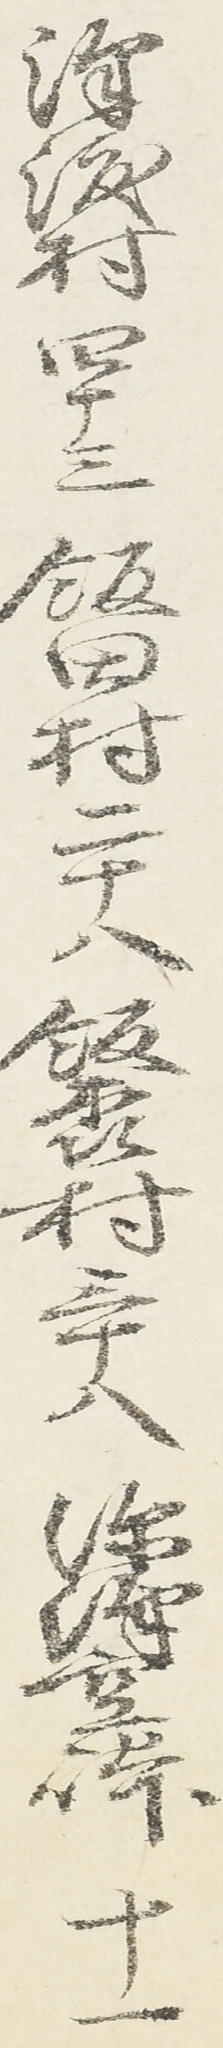沢渡村四十三飯田村二十八飯森村三十八深沢空崎十一
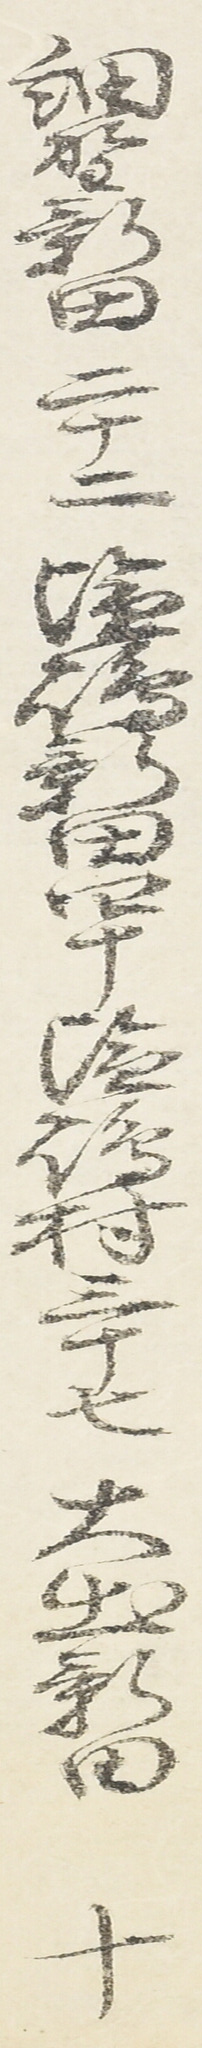細野新田二十二塩嶋新田四十塩嶋村三十七大出新田十
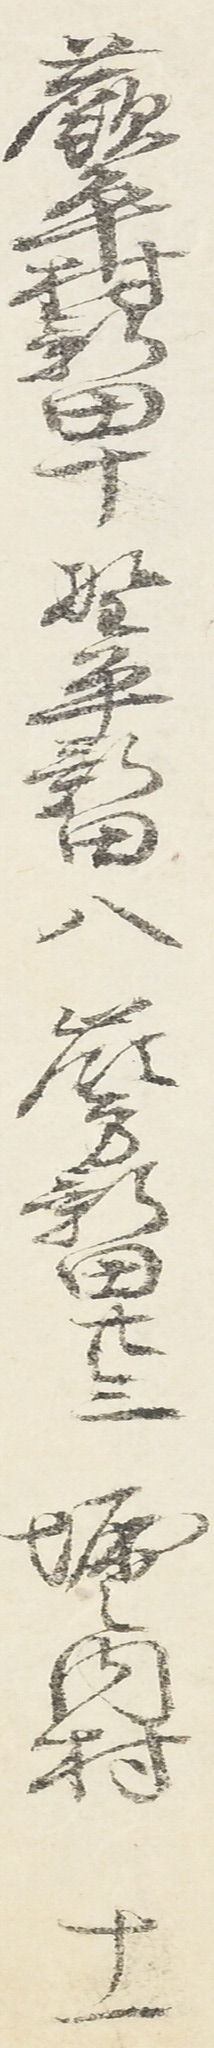蕨平村新田十野平新田八嶺方新田廿三堀之内村十一

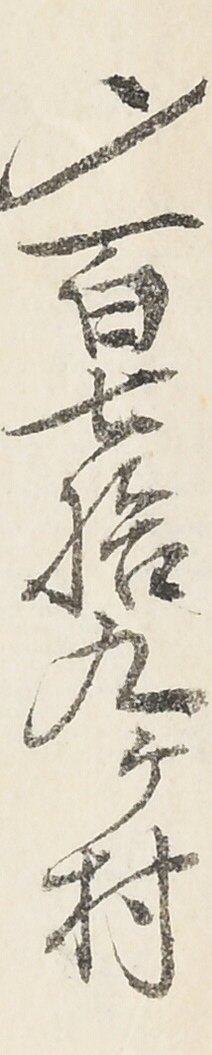〆百七拾九ヶ村
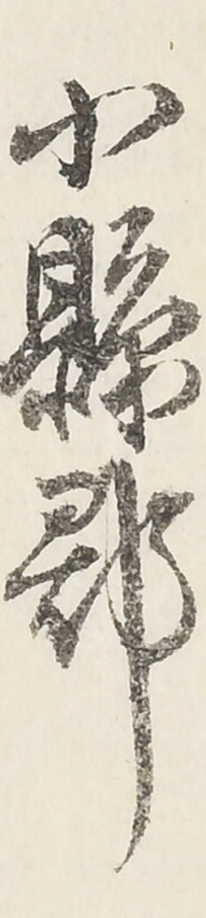小県郡
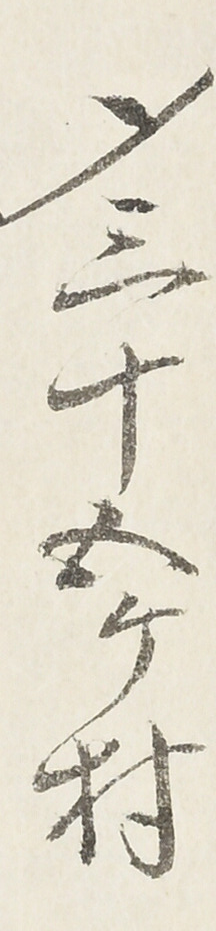〆三十五ヶ村
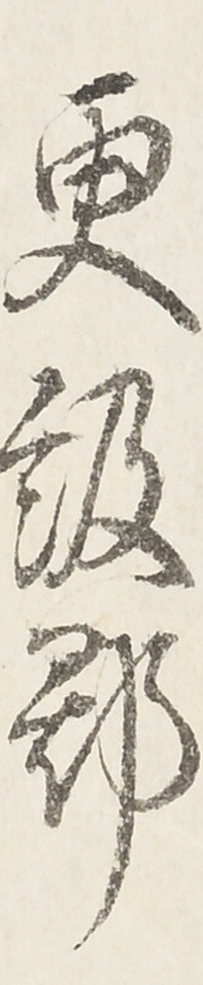更級郡

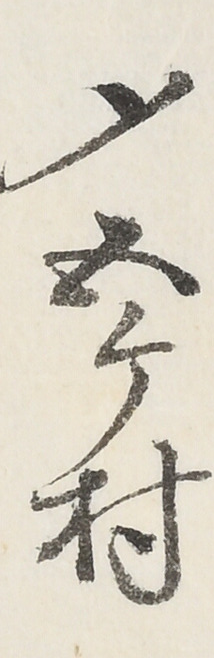〆五ヶ村
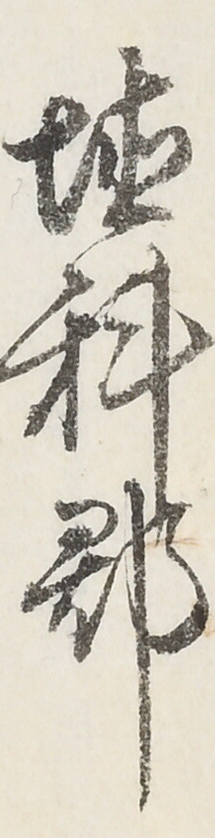埴科郡
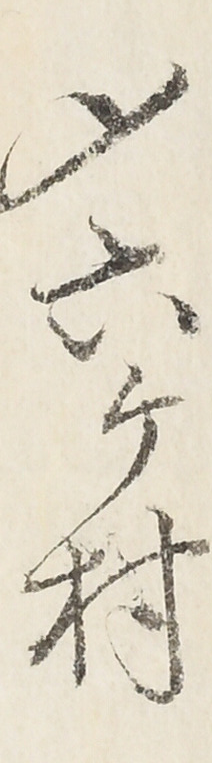〆六ヶ村
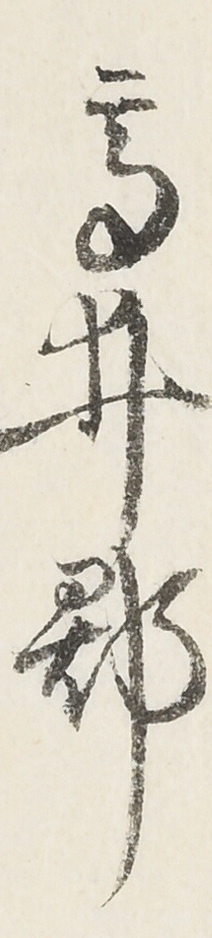高井郡
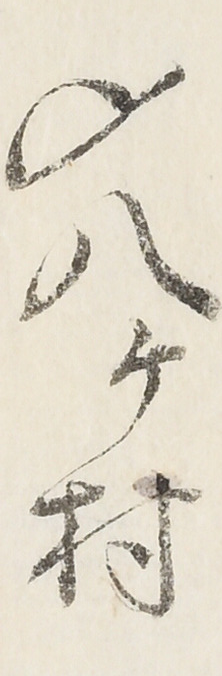〆八ヶ村
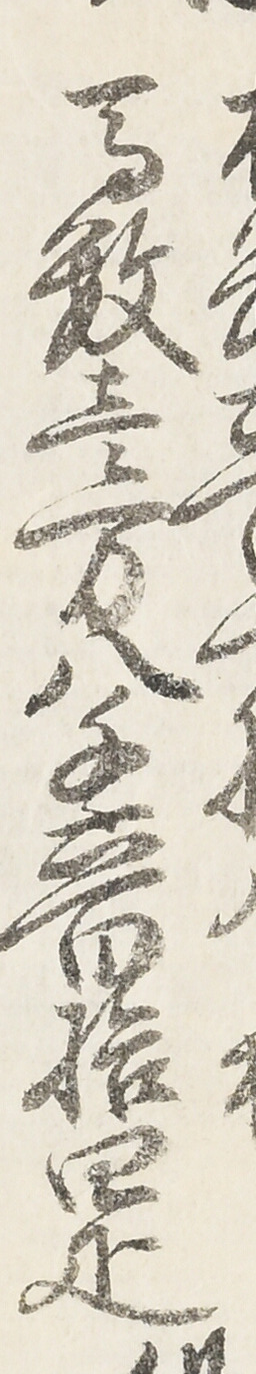馬数壱反八千六百拾四疋
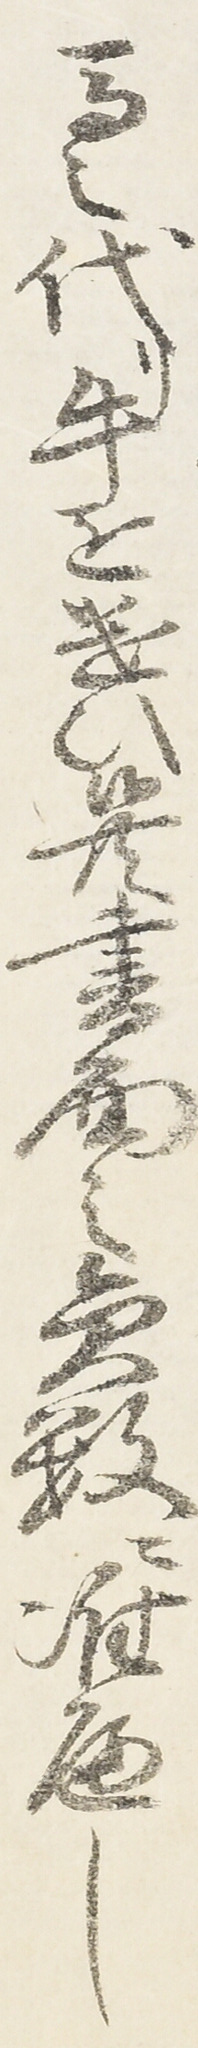馬之代リ牛を遣ひ候共書面之員数ニ准へし
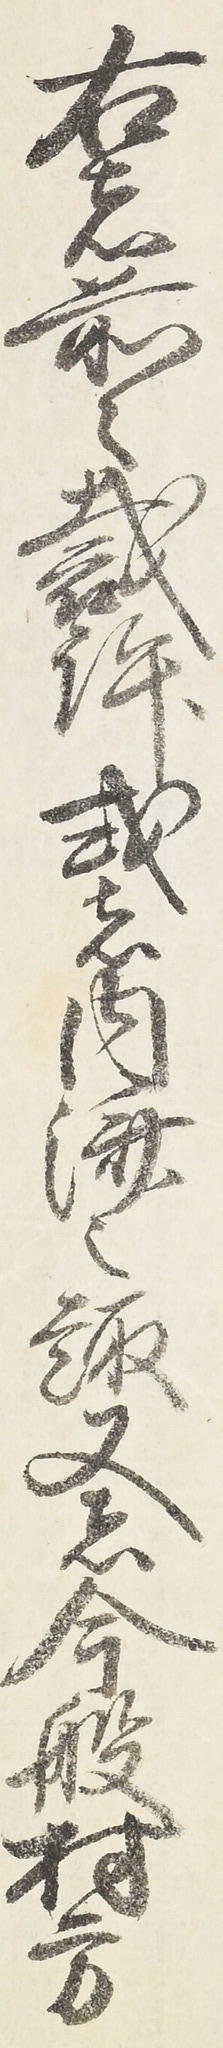右は前々裁許或は内済之趣又は今般村方
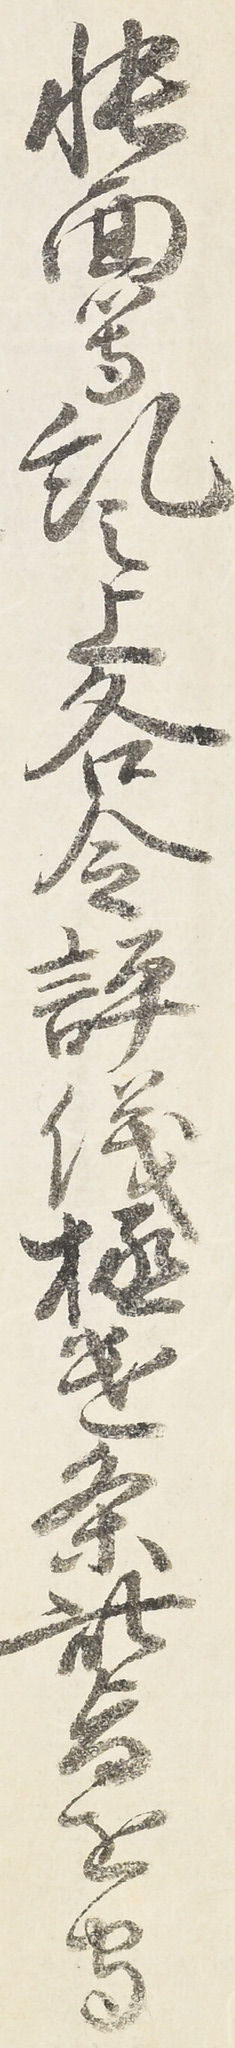帳面等糺之上各令評儀極遣条此旨を守
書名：中馬御裁許帳面
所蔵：伊那市立高遠町図書館・合同会社AMANE
